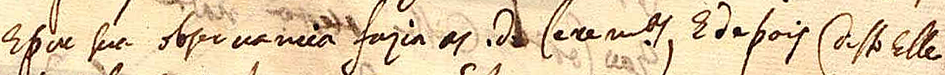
E por sua obseruancia fazia as .d. Cerem.as, E depois disso Elle
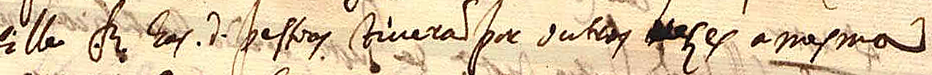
Elle R. E as .d. pessoas tiueraõ por outras _ezes a mesma
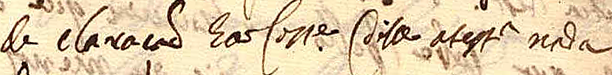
declaraçaõ E ao Cost.e disse a testa nada
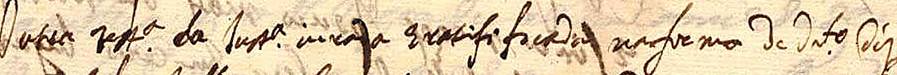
Outra test.a da Iust.a iurada E ratificada na forma de dr.to diz
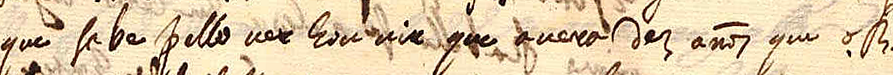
que sabe pello uer E ouuir que auera dez an̄os que o .R.
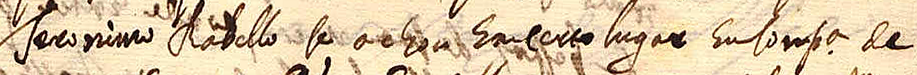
Jeronimo Rabello se achou En certo lugar En Comp.a de
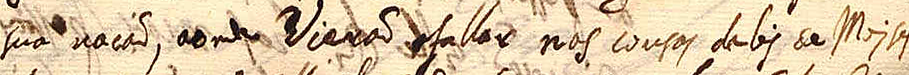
sua nacaõ, aonde Vieraõ a fallar nas cousas da lej de Mojses
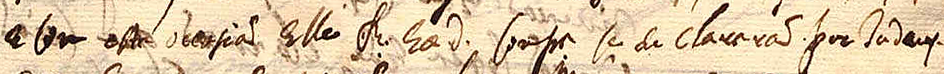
E con esta occasiaõ Elle R. E a .d. Conp.a se declararaõ por Iudeus
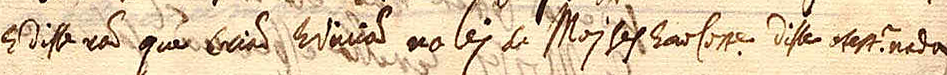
E disseraõ que criaõ E viuiaõ na lej de Mojses E ao cost.e disse a test.a nada
